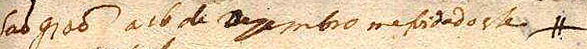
Saõ giaõ a 16 de Dezembro me foi dado este
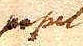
papel
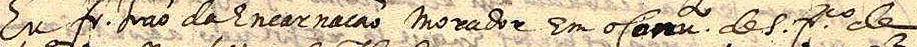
Eu fr. Ioaõ da Encarnacão morador Em o Conuto. de s. fr.co de
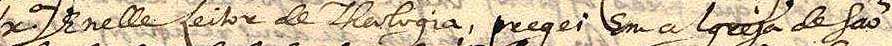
Lxa E nelle Leitor de Theologia, pregei Em a Igreja de saõ
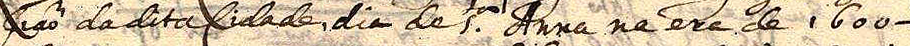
Giaõ da dita Cidade, dia de s.ta Anna na era de 1600
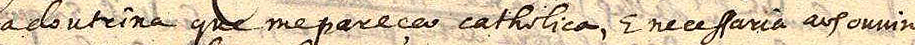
a doutrina que me pareçeo catholica, E necessaria aos ouuin
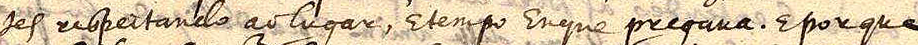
tes respeitando ao lugar, E tempo En que pregaua. E porque
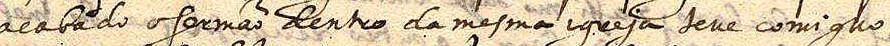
acabado o sermão dentro da mesma igreja teue comiguo
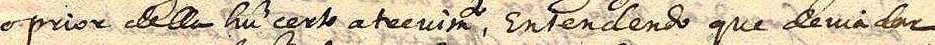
o prior della hū certo atreuimto, Entendendo que deuia dar
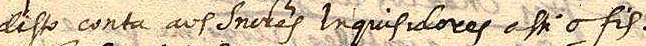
disto conta aos Snorēs Inquisidores assi o fis.
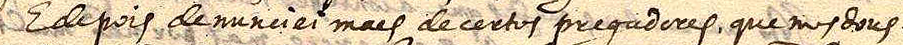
E depois denunciei maes de certos pregadores que nos dous
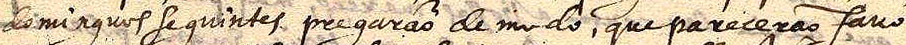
dominguos seguintes pregaraõ de modo, que parecerão fauo
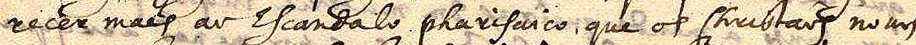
recer maes ao Escandalo pharisaico, que os Christaõs nouos
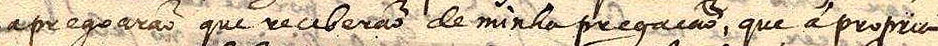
apregoaraõ que receberaõ de minha pregacão, que á propria
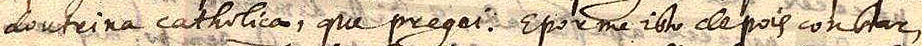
doutrina catholica, que pregei. E por me isto depois constar,
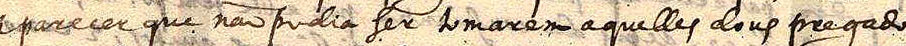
E parecer que não podia ser tomarem aquelles dous pregado
